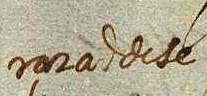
razaõ de se
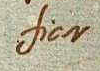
fiar
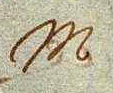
m
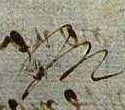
m
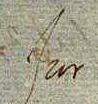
Jur
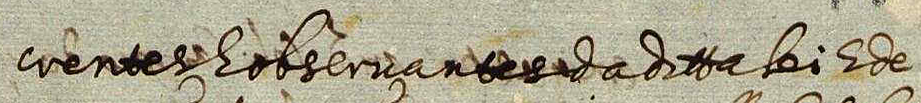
crentes E obseruantes da ditta lei E de
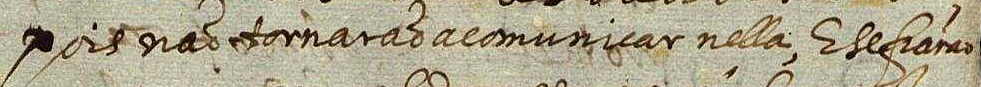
pois naõ tornaraõ a comunicar nella, E se fiarão
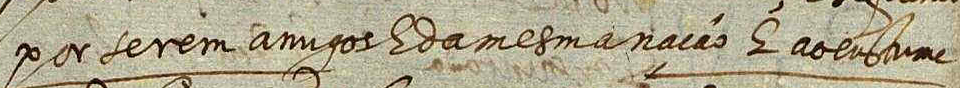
por serem amigos E da mesma nação E ao custume
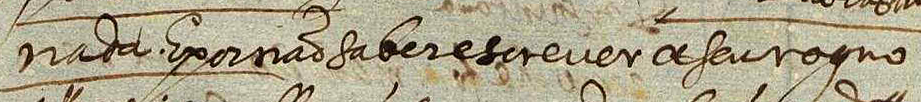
nada. E por naõ saber escreuer a seu roguo
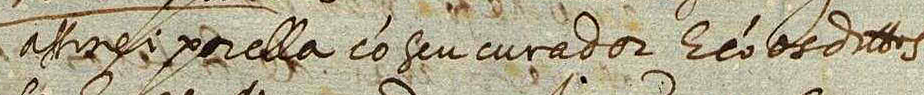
assinei por ella cō seu curador E cō os dittos
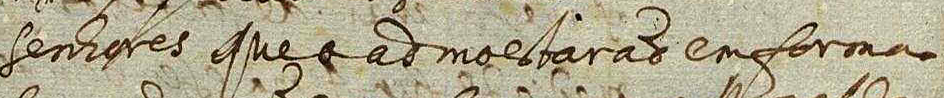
senhores que a admoestaraõ em forma
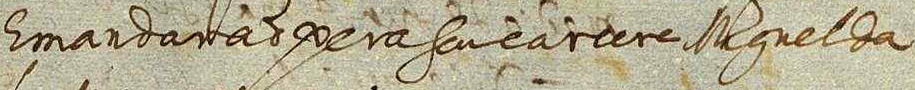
E mandaraõ pera seu carcere Miguel da
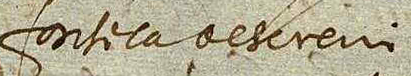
fonseca o escreui
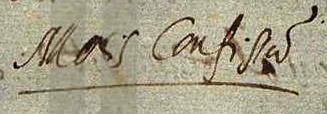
Mais Confissaõ
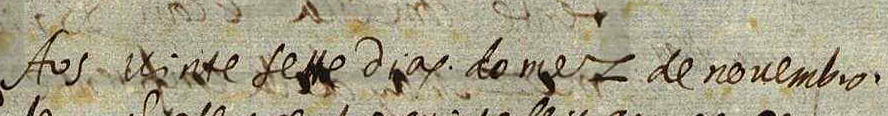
Aos vinte sette dias do mez de nouembro
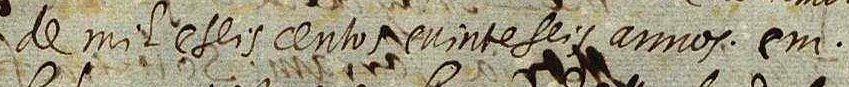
de mil e seiscentos e uinte seis annos. em
